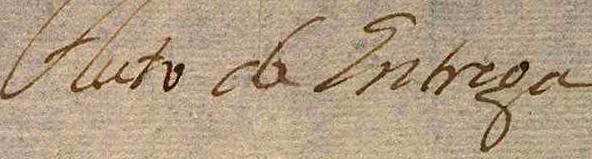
Auto de Entrega
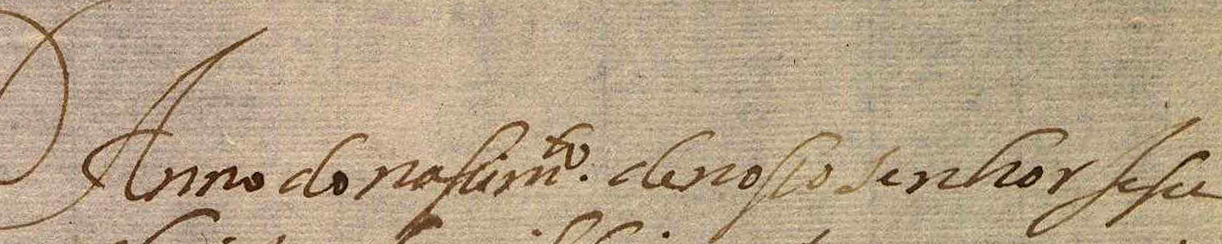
Anno do nascimto. de nosso senhor Jesu
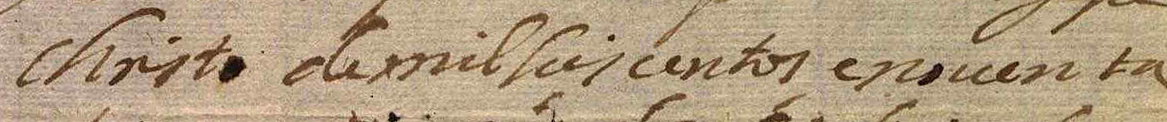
christo de mil seiscentos e nouenta
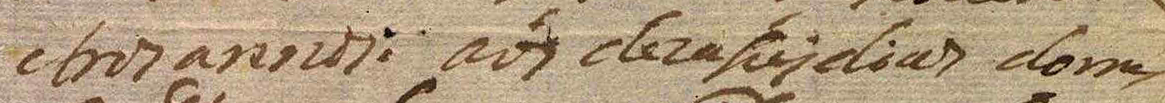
e tres annos. aos dezaseis dias do mes
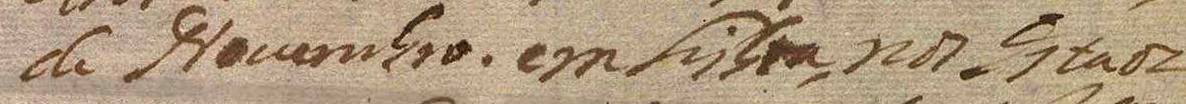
de Nouembro. em Lisboa, nos Estaos
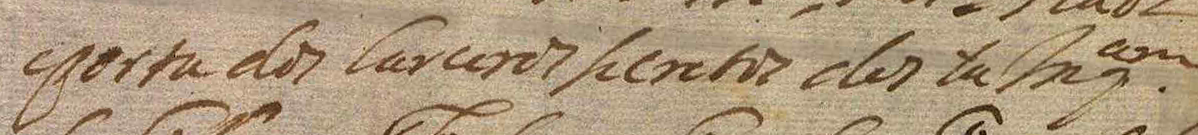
e porta dos Carceres secretos desta Inq.çam
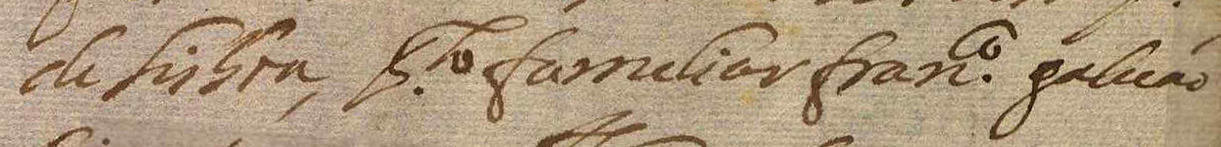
de Lisboa, p.lo familiar fran.co galuaõ
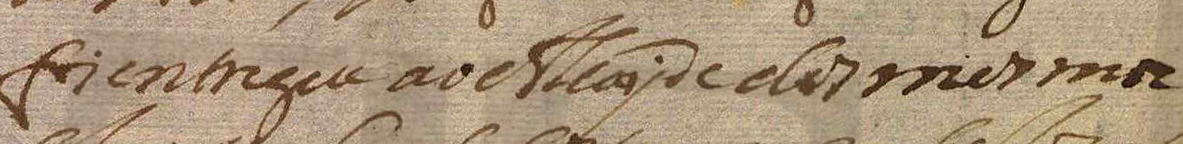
foi entregue ao Alcayde dos mesmos
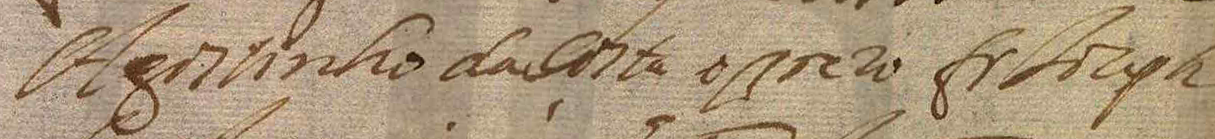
Agostinho da Costa o prezo fr Iozeph
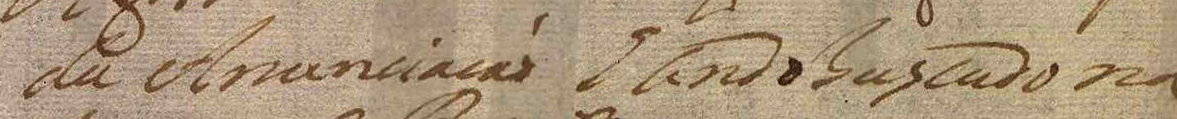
da Anunciaçaõ, E sendo buscado na
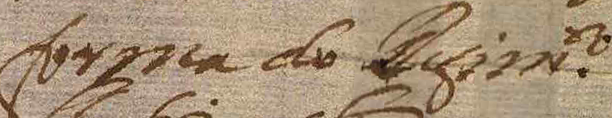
forma do Regim.to
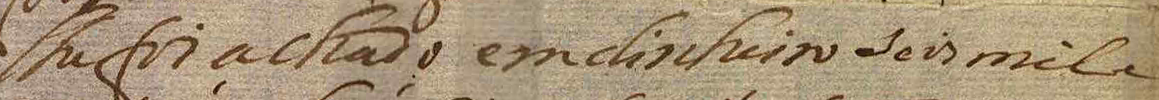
lhe foi achado em dinheiro seis mil e
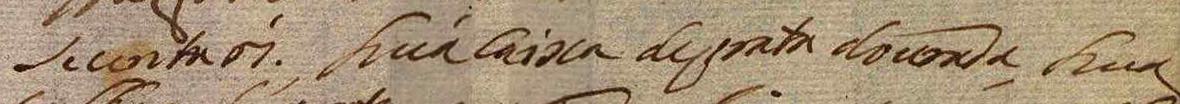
secenta rs̄., huā caixa de prata dourada, hua
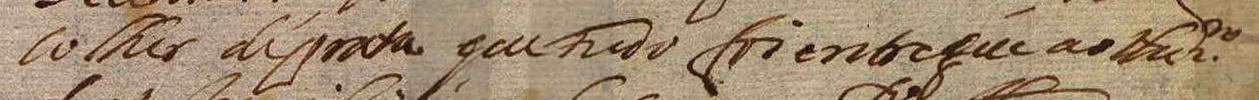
colher de prata que tudo foi entregue ao thez.ro
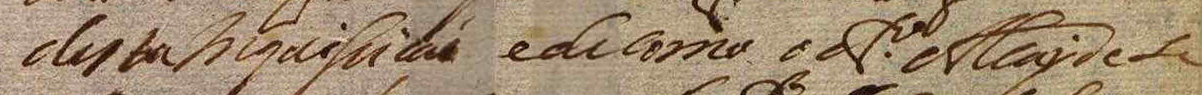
desta Inquissiçaõ e de como o d.o Alcayde se
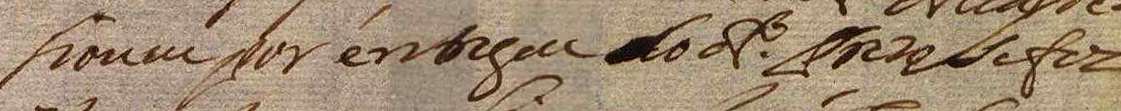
houue por entregue do d.o prezo se fez
